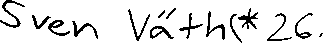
Sven Väth (* 26.
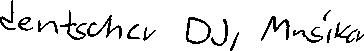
deutscher DJ, Musiker
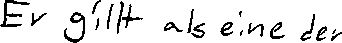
Er gilt als einer der
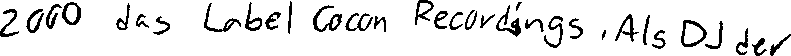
2000 das Label Cocoon Recordings. Als DJ der
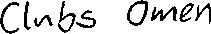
Clubs Omen
